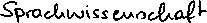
Sprachwissenschaft
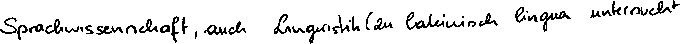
Sprachwissenschaft, auch Linguistik (zu lateinisch lingua untersucht
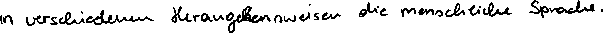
in verschiedenen Herangehensweisen die menschliche Sprache.
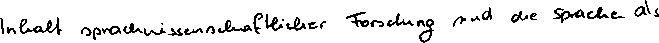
Inhalt sprachwissenschaftlicher Forschung sind die Sprache als
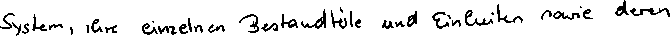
System, ihre einzelnen Bestandteile und Einheiten sowie deren
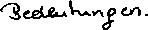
Bedeutungen.
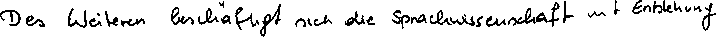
Des Weiteren beschäftigt sich die Sprachwissenschaft mit Entstehung,
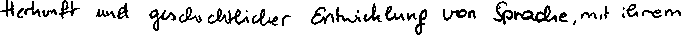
Herkunft und geschichtlicher Entwicklung von Sprache, mit ihrem
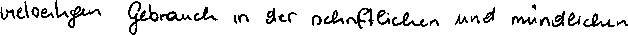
vielseitigen Gebrauch in der schriftlichen und mündlichen
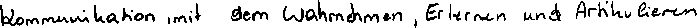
Kommunikation, mit dem Wahrnehmen, Erlernen und Artikulieren
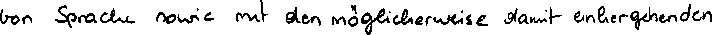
von Sprache sowie mit den möglicherweise damit einhergehenden
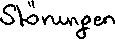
Störungen.
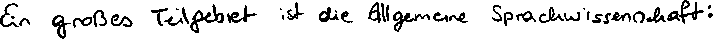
Ein großes Teilgebiet ist die Allgemeine Sprachwissenschaft:
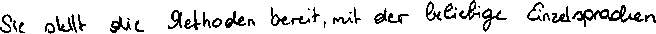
Sie stellt die Methoden bereit, mit der beliebige Einzelsprachen
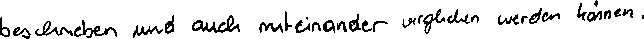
beschrieben und auch miteinander verglichen werden können.
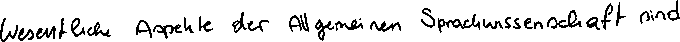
Wesentliche Aspekte der Allgemeinen Sprachwissenschaft sind
